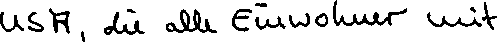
USA, die alle Einwohner mit
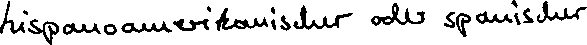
hispanoamerikanischer oder spanischer
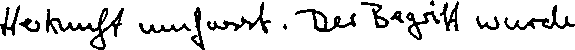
Herkunft umfasst. Der Begriff wurde
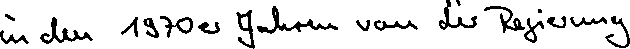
in den 1970er Jahren von der Regierung
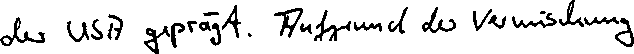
der USA geprägt. Aufgrund der Vermischung
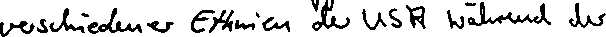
verschiedener Ethnien der USA während der
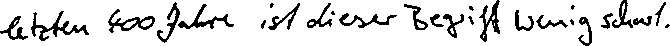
letzten 400 Jahre ist dieser Begriff wenig scharf.
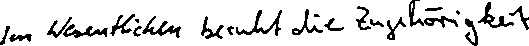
Im Wesentlichen beruht die Zugehörigkeit
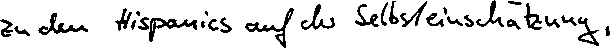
zu den Hispanics auf der Selbsteinschätzung,
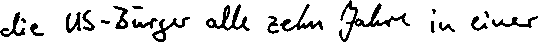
die US-Bürger alle zehn Jahre in einer
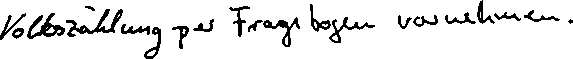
Volkszählung per Fragebogen vornehmen.
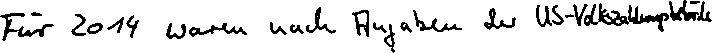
Für 2014 waren nach Angaben der US-Volkszählungsbehörde
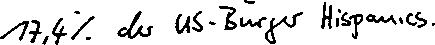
17,4 % der US-Bürger Hispanics.
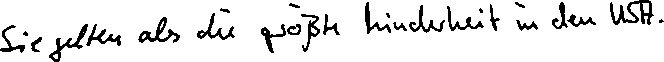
Sie gelten als die größte Minderheit in den USA.
